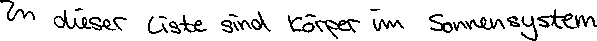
In dieser Liste sind Körper im Sonnensystem
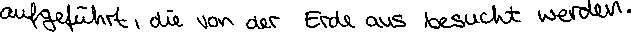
aufgeführt, die von der Erde aus besucht wurden.
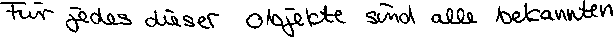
Für jedes dieser Objekte sind alle bekannten
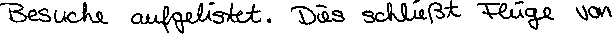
Besuche aufgelistet. Dies schließt Flüge von
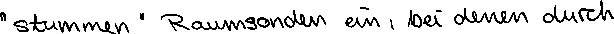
"stummen" Raumsonden ein, bei denen durch
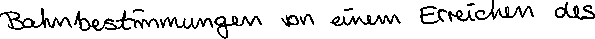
Bahnbestimmungen von einem Erreichen des
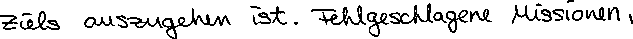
Ziels auszugehen ist. Fehlgeschlagene Missionen,
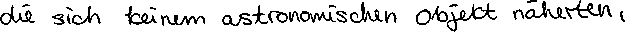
die sich keinem astronomischen Objekt näherten,
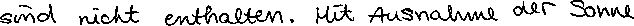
sind nicht enthalten. Mit Ausnahme der Sonne
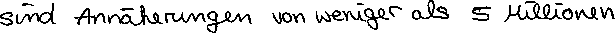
sind Annäherungen von weniger als 5 Millionen
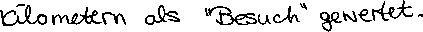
Kilometern als "Besuch" gewertet.
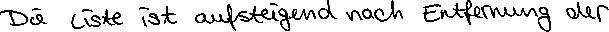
Die Liste ist aufsteigend nach Entfernung der
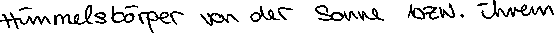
Himmelskörper von der Sonne bzw. ihrem
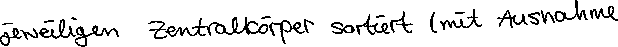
jeweiligen Zentralkörper sortiert (mit Ausnahme
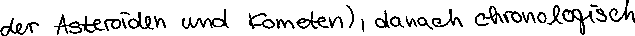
der Asteroiden und Kometen), danach chronologisch
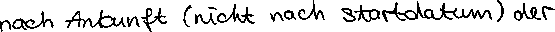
nach Ankunft (nicht nach Startdatum) der
